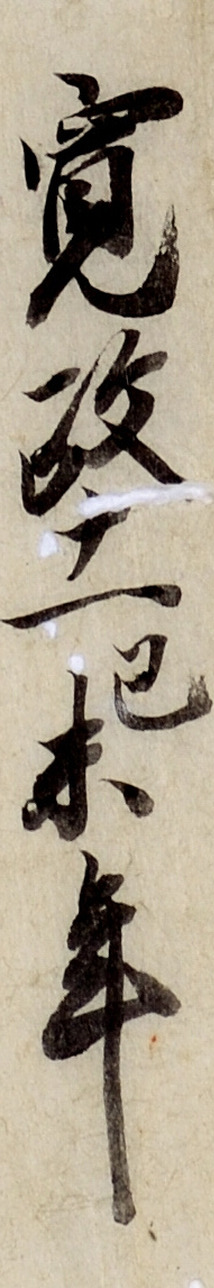寛政十一己未年
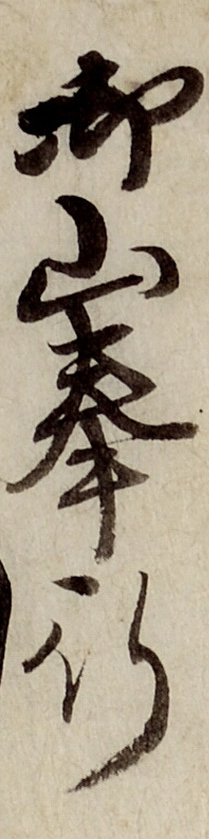御山奉行
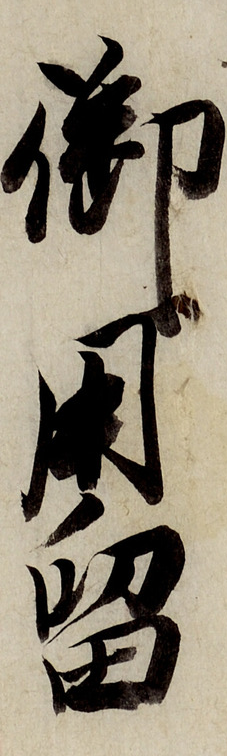御用留
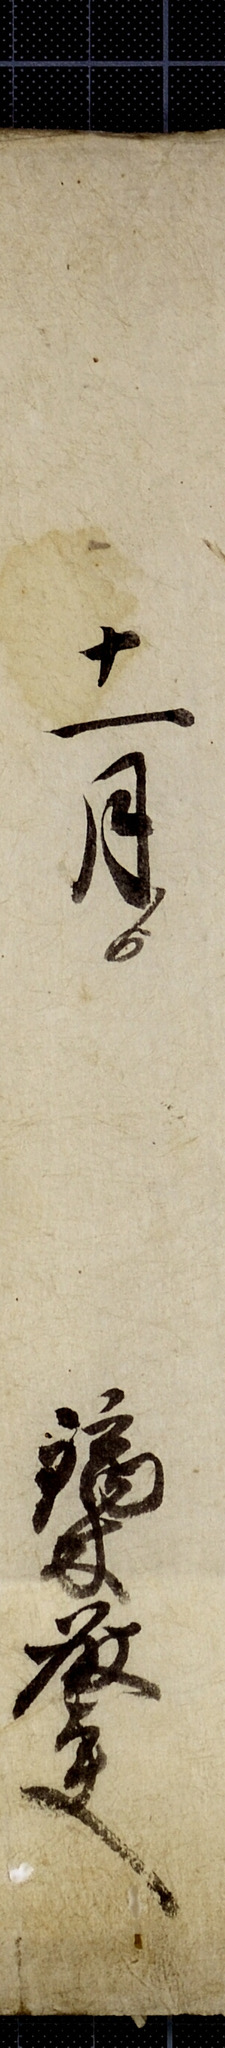十一月ヨリ鏑木藤大夫

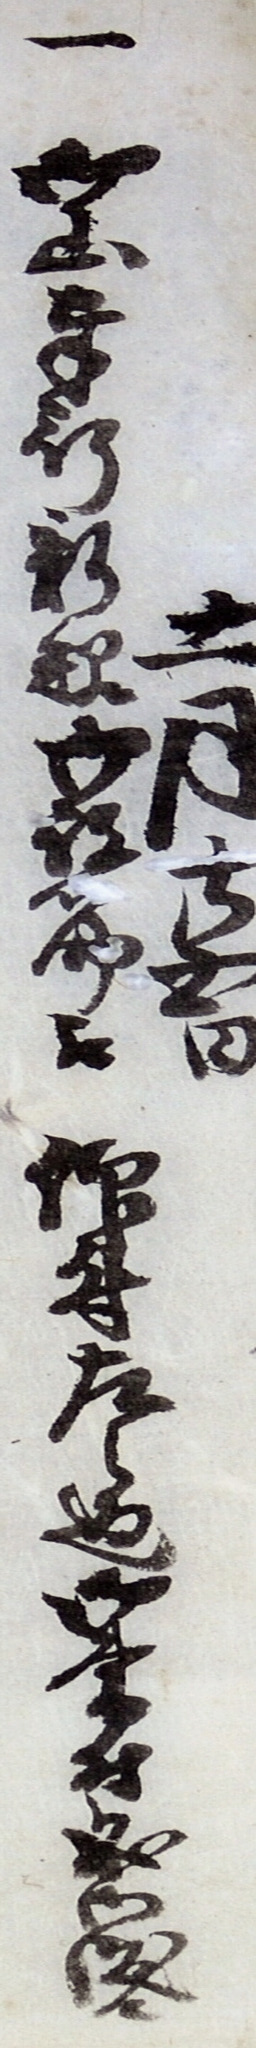一御山奉行新規御役筋被仰付左之通御書付被成御渡候
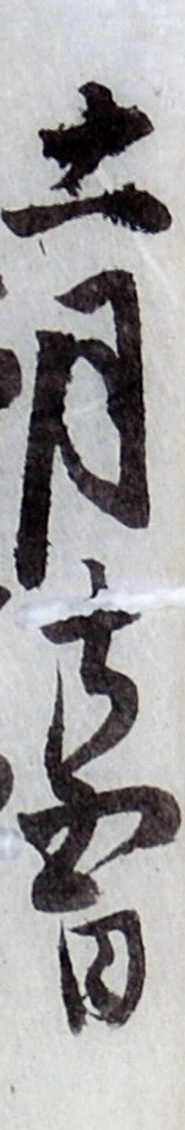十一月廿五日
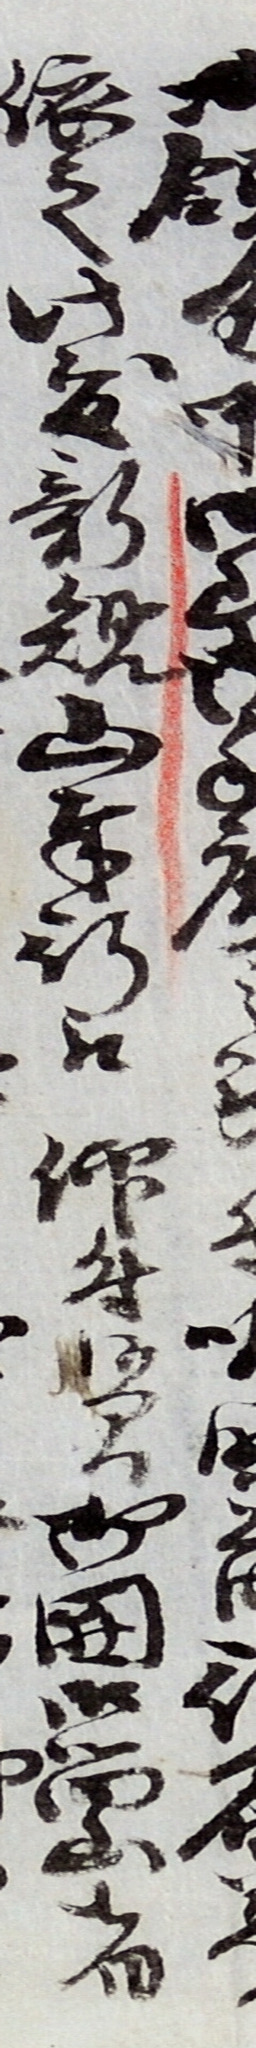之依此度新規山奉行被仰付候間御囲御留山者
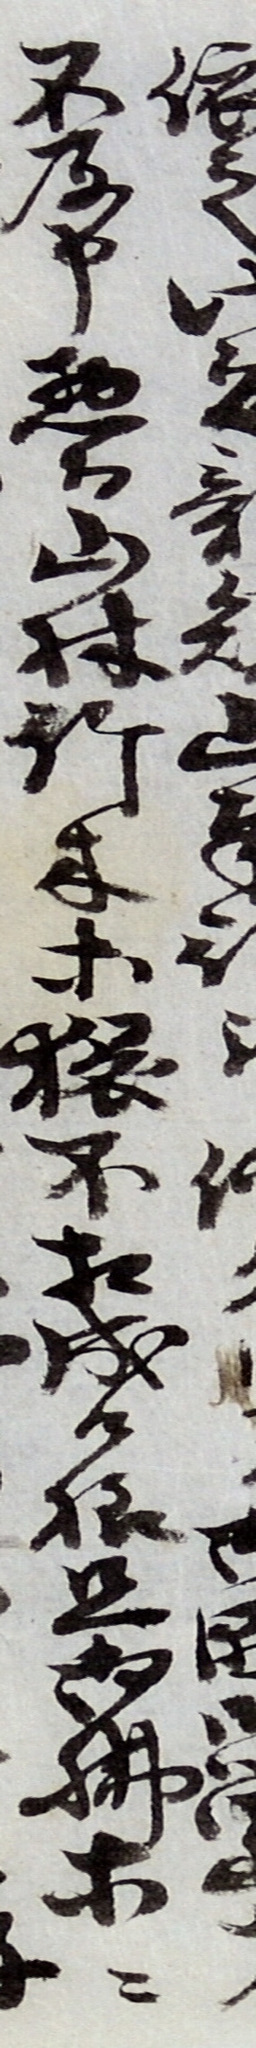不及申惣而山林竹木等猥不相成候様且御払等ニ
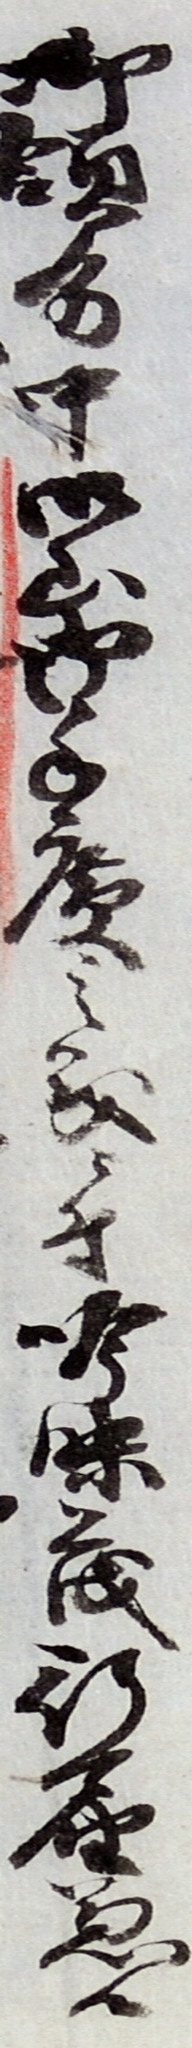御領分中御山御手広之義ニ付吟味茂行届兼候
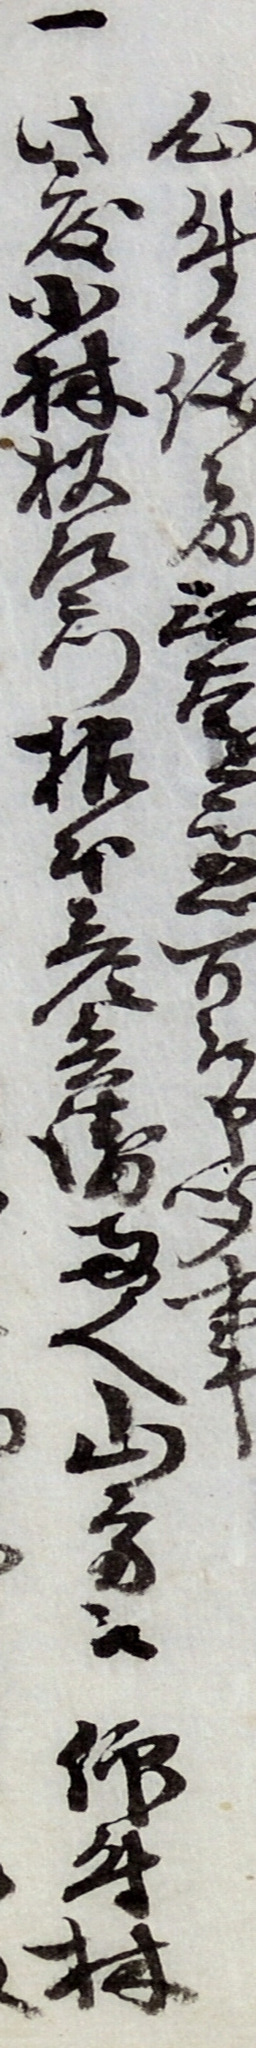一此度小林杦左衛門根本彦兵衛両人山方被仰付林
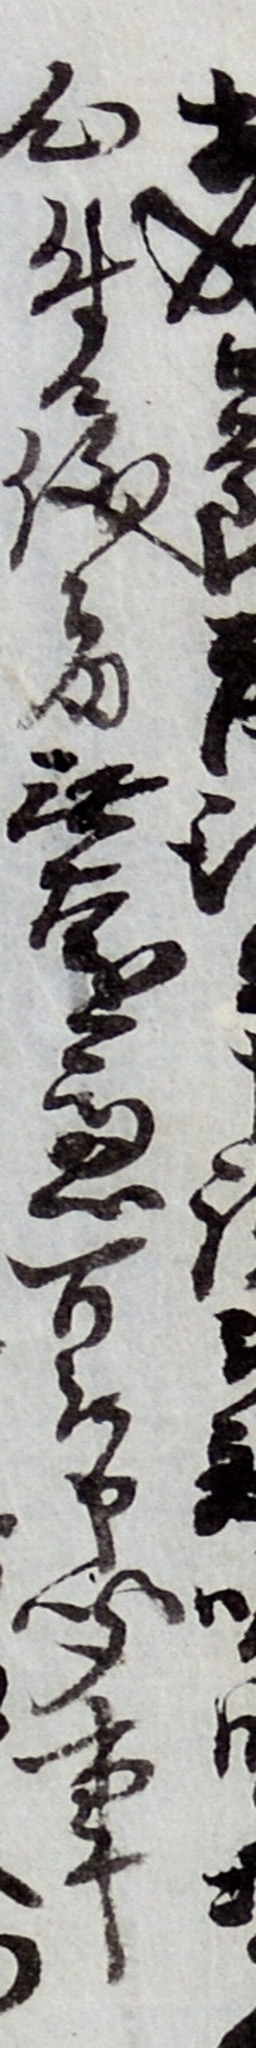心付候儀者無遠慮可被申聞事
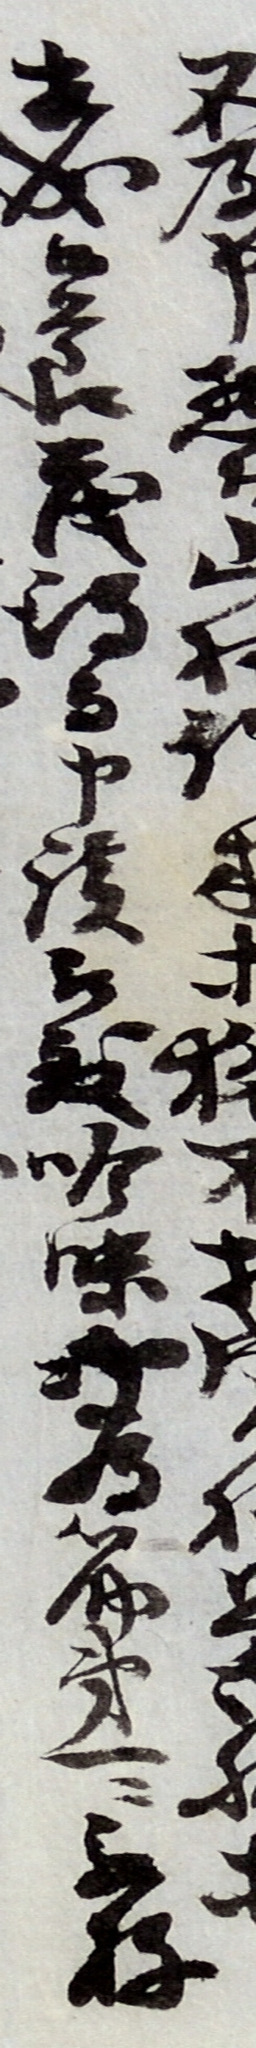相成候節茂得与申談被致吟味御為筋第一ニ取扱
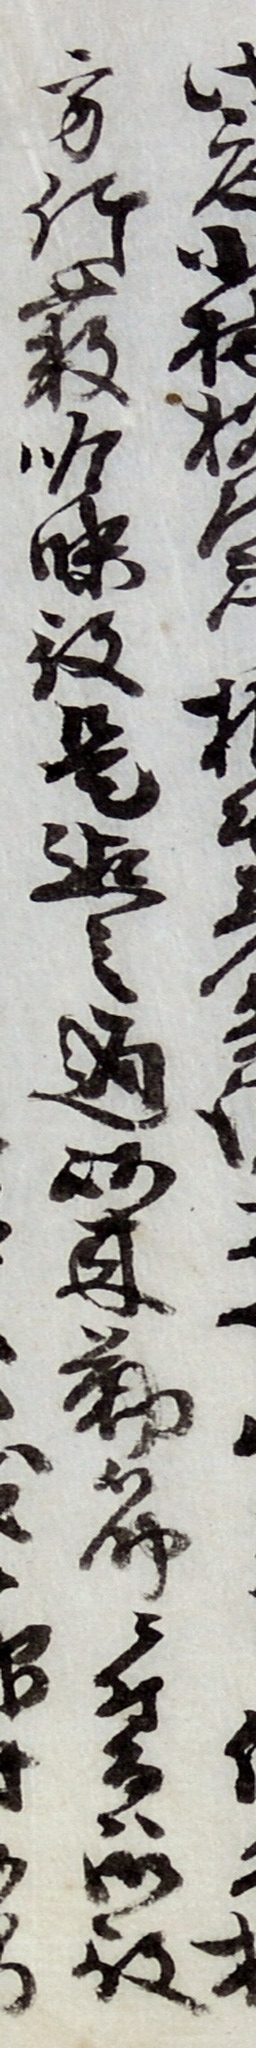方竹藪吟味役是迠之通以来勤筋ニ付而ハ御役
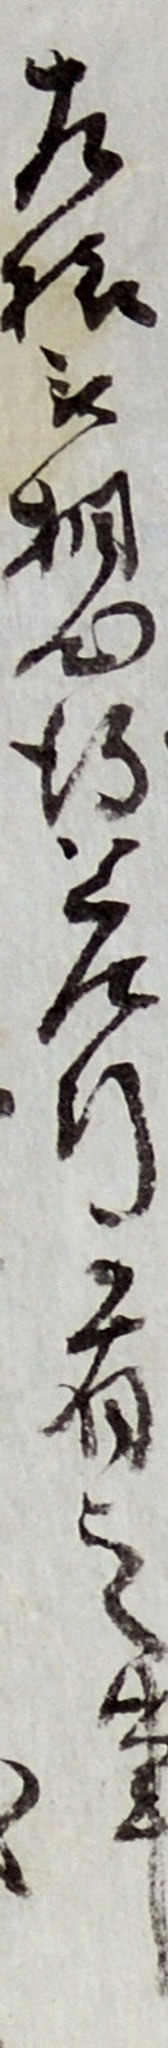左様被相心得差引ヲ有之事
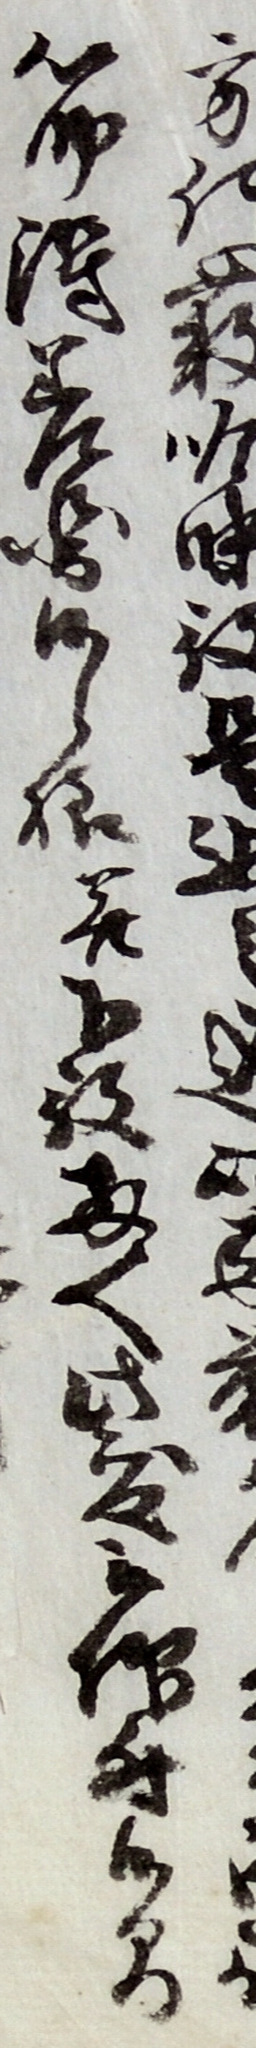筋得差図候様并下役両人此度被仰付候間
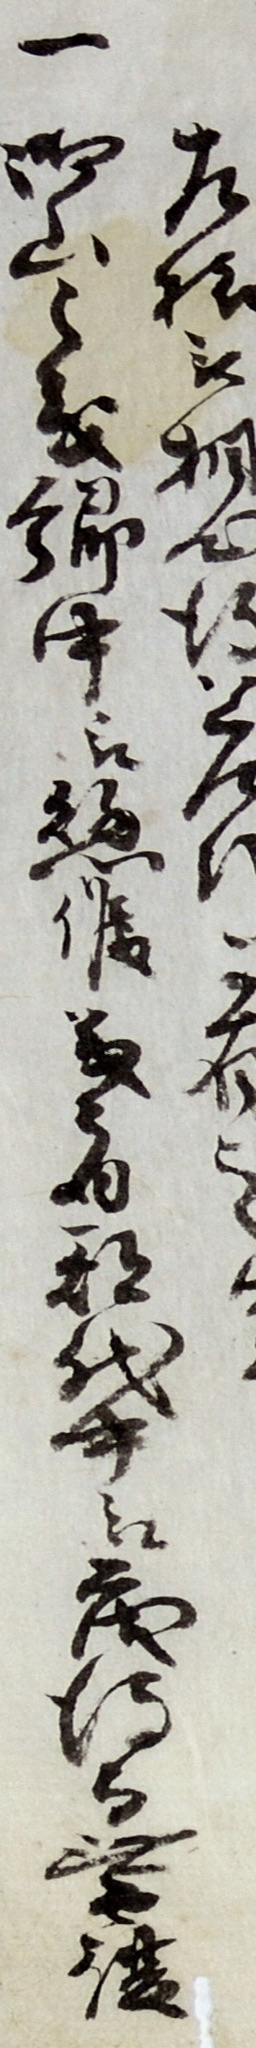一御山之義郷中江懸候義者郡代中江茂得与無腹
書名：御山奉行御用留
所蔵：伊那市立高遠町図書館・合同会社AMANE
